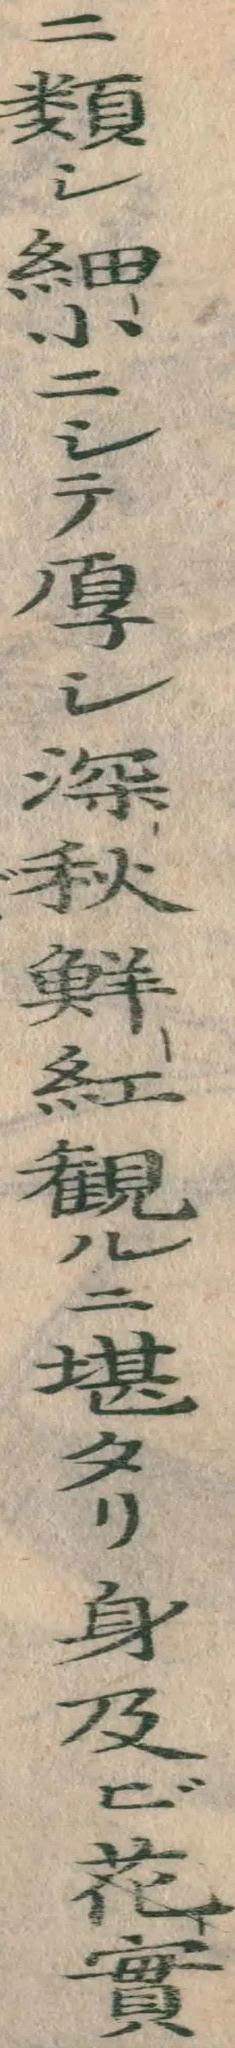ニ類シ細-小ニシテ厚シ深-秋鮮-紅観ルニ堪タリ身及ビ花-実
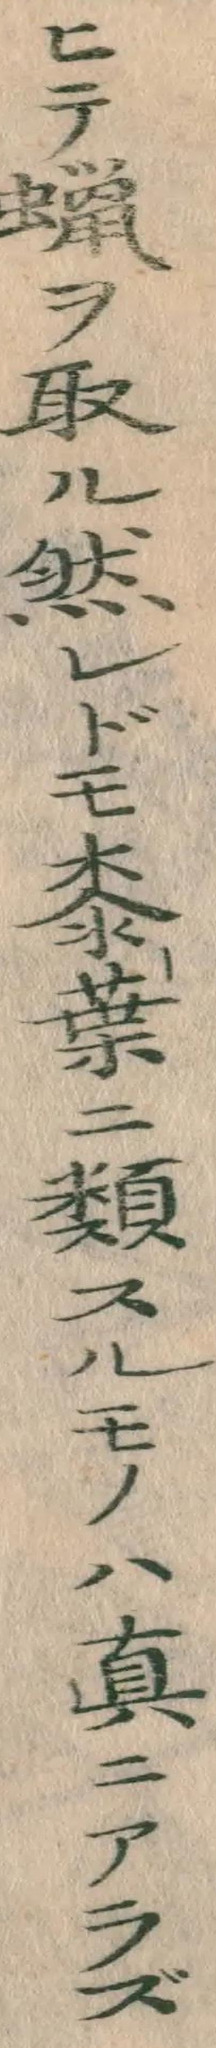ヒテ蝋ヲ取ル然レドモ桼-葉ニ類スルモノハ真ニアラズ
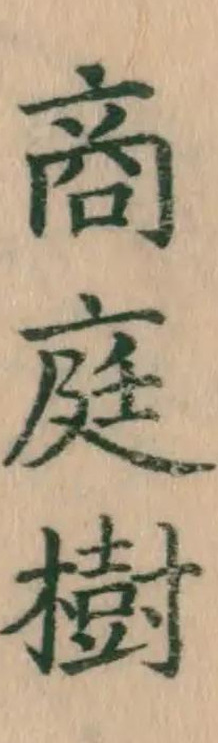商庭樹

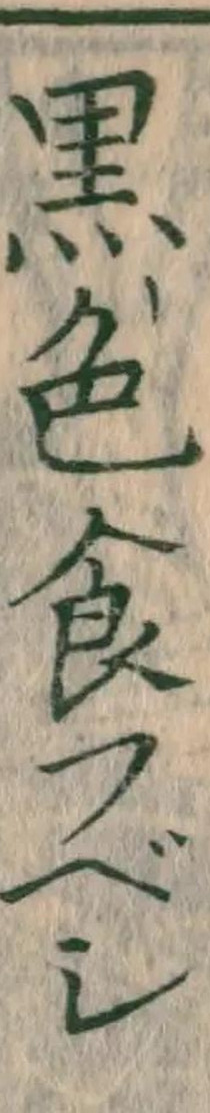黒-色食フベシ
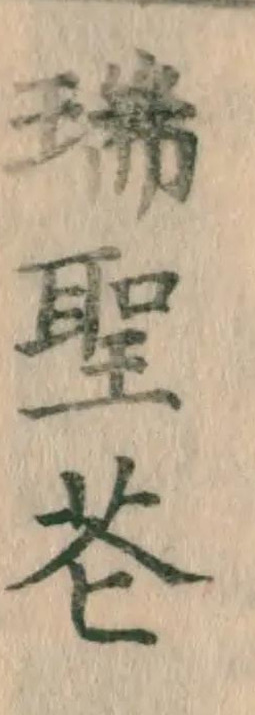瑞聖花

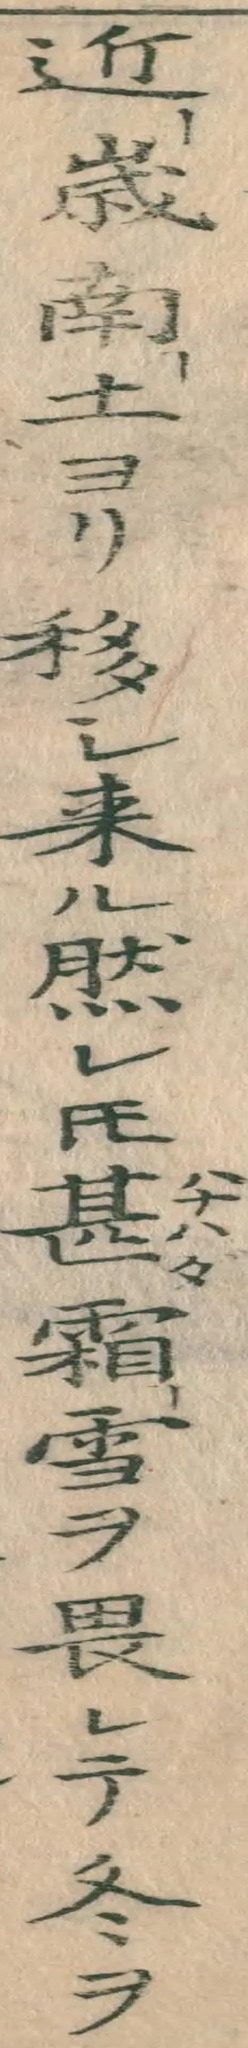近-歳南-土ヨリ移シ来ル然レトモ甚霜-雪ヲ畏レテ冬ヲ
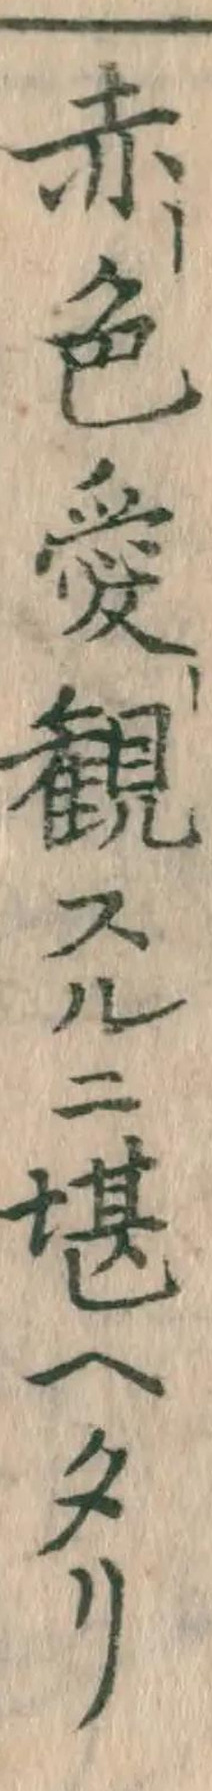赤-色愛-観スルニ堪ヘタリ

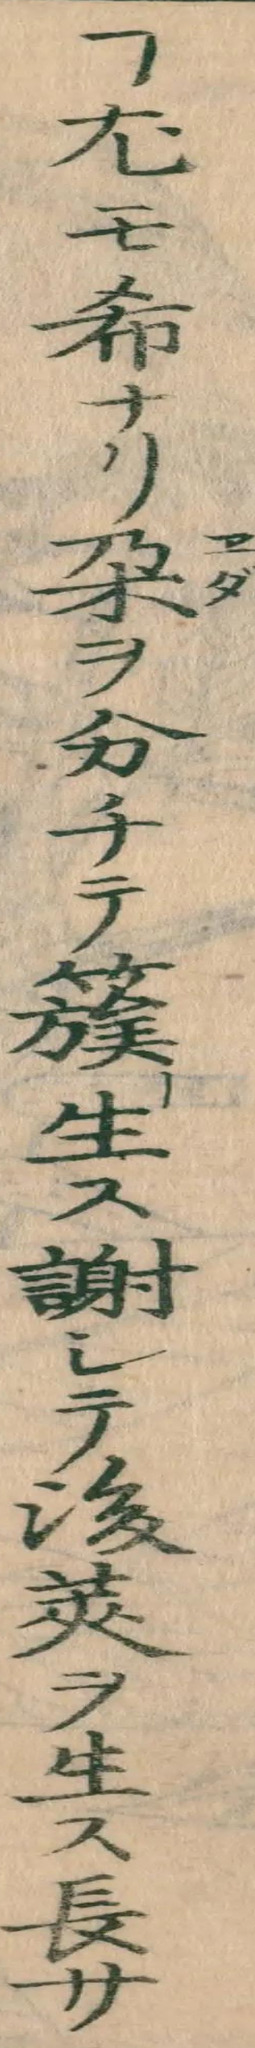ヿ尤モ希ナリ朶ヲ分チテ簇-生ス謝シテ後莢ヲ生ス長サ
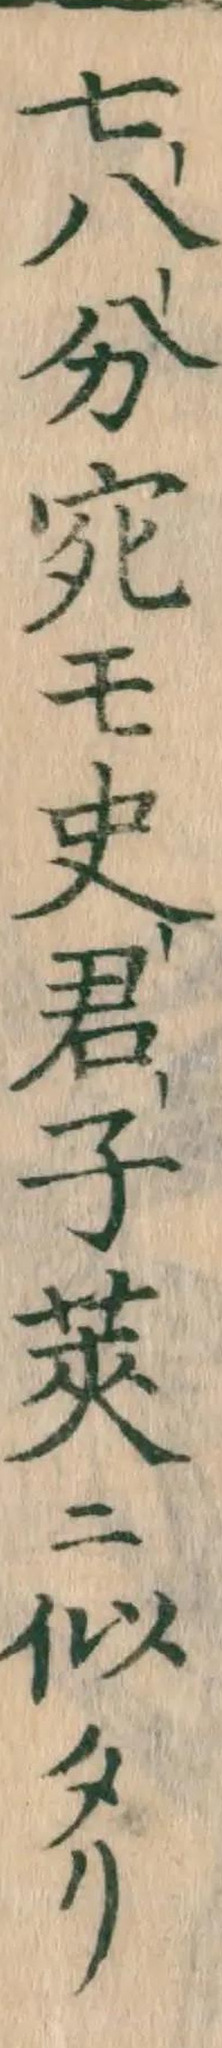七-八-分宛モ史-君-子莢ニ似タリ
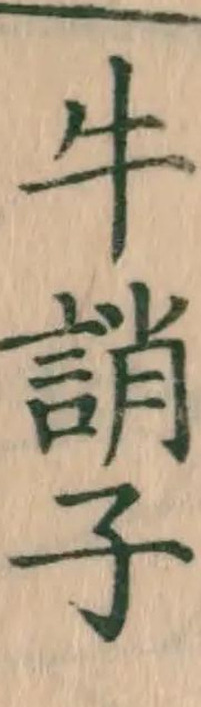牛誚子

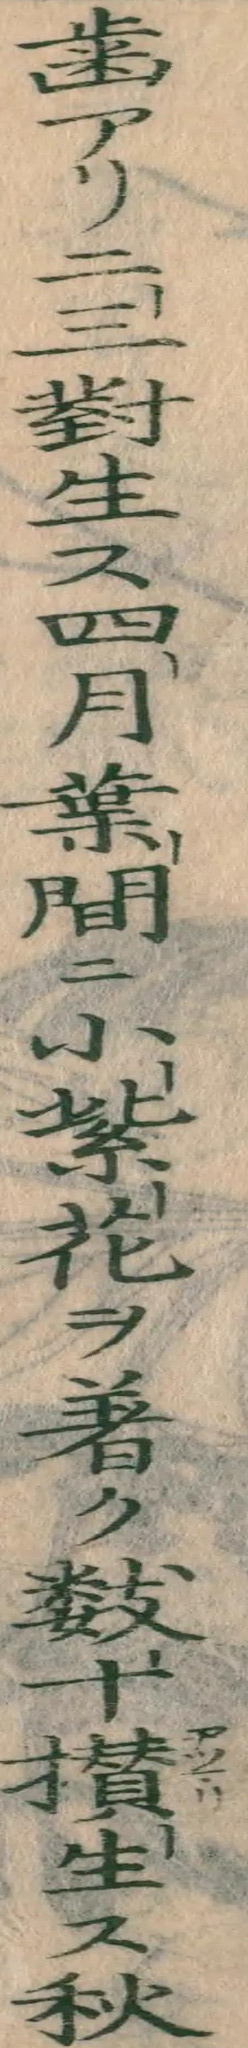歯アリ二-三対生ス四-月葉-間ニ小-紫-花ヲ着ク数-十攢-生ス秋
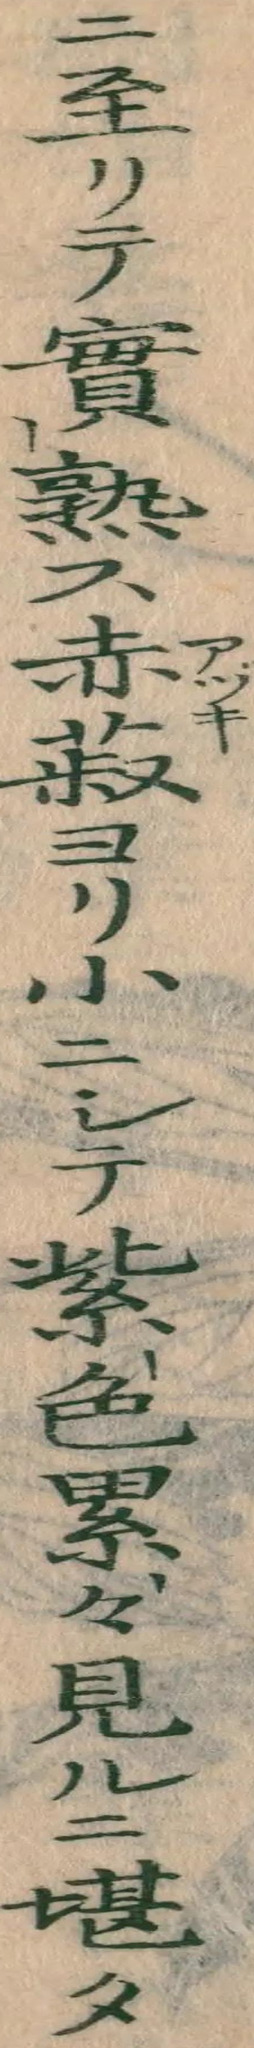ニ至リテ実-熟ス赤菽ヨリ小ニシテ紫-色累-々見ルニ堪タ
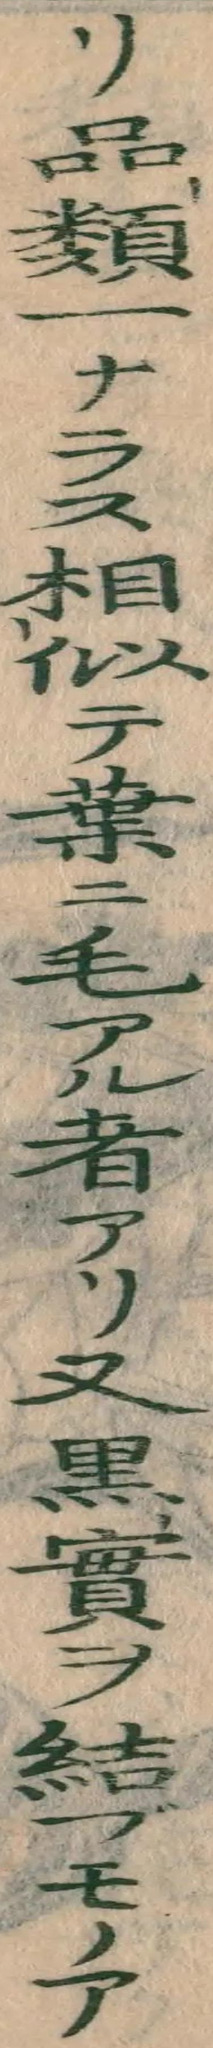リ品-類一ナラス相-似テ葉ニ毛アル者アリ又黒-実ヲ結ブモノア
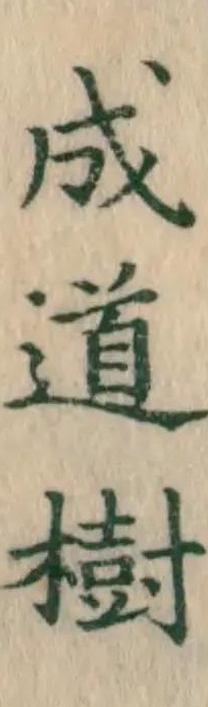成道樹

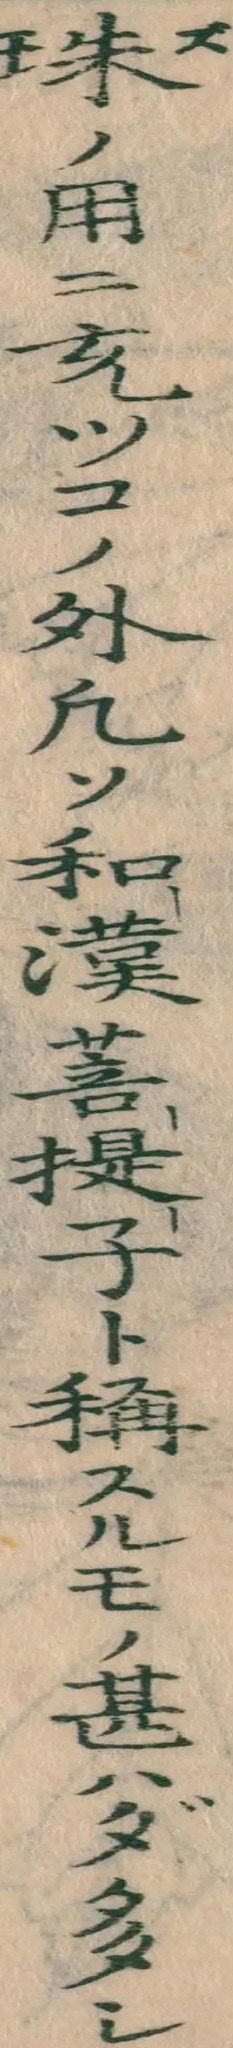珠ノ用ニ充ツコノ外凡ソ和-漢菩-提-子ト称スルモノ甚ハダ多シ
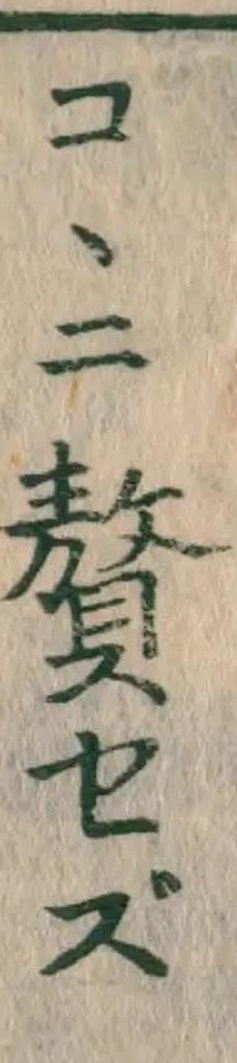コヽニ贅セズ
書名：花彙 草部4巻木部4巻. [2]
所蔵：国立国会図書館 National Diet Library, JAPAN
